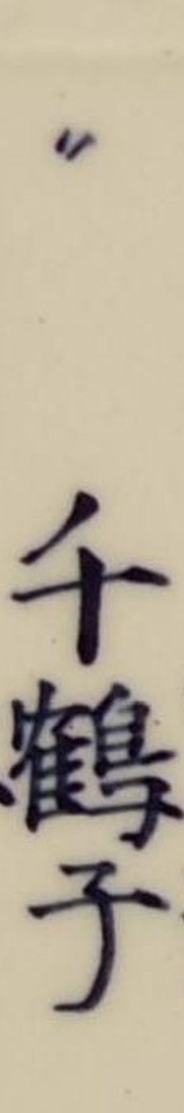千鶴子
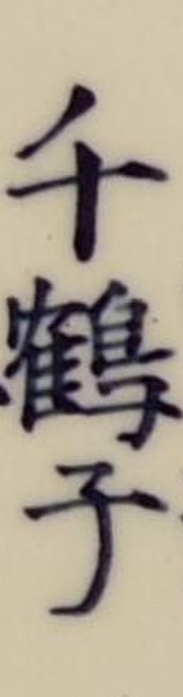千鶴子
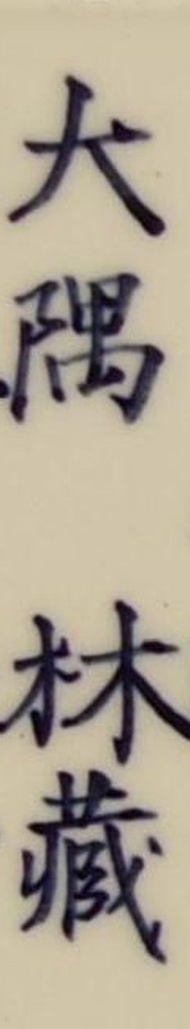大隅林蔵
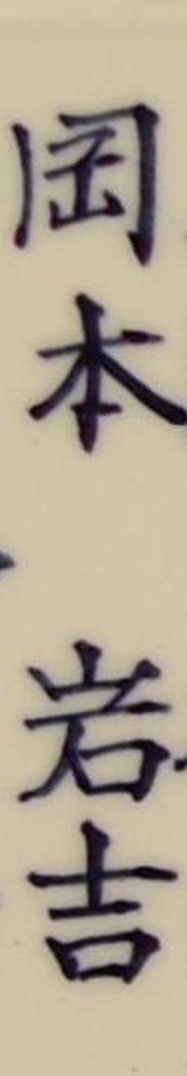岡本岩吉
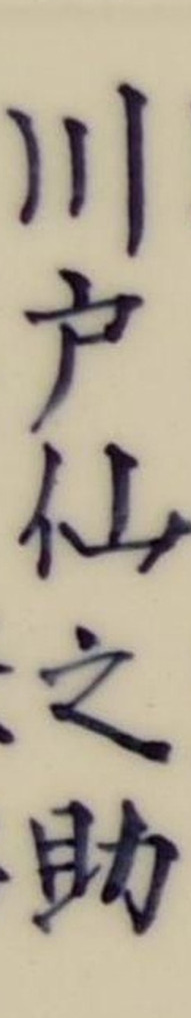川戸仙之助
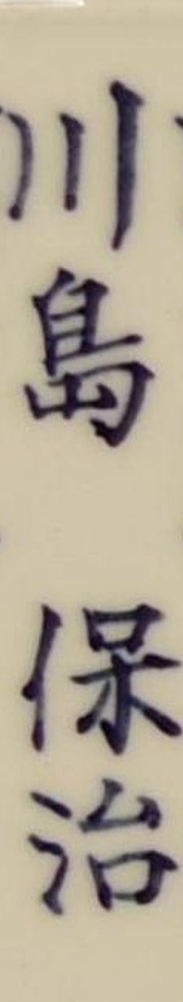川島保治
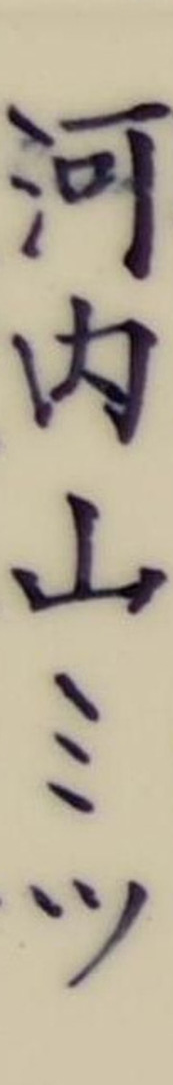河内山ミツ
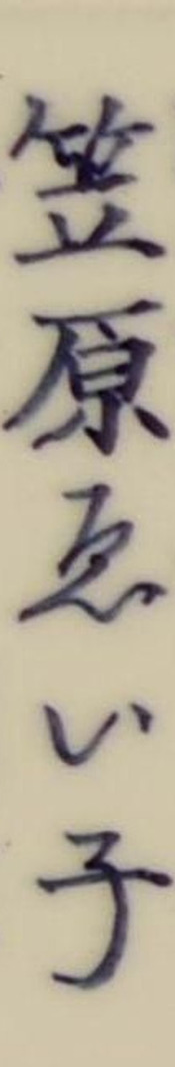笠原えい子
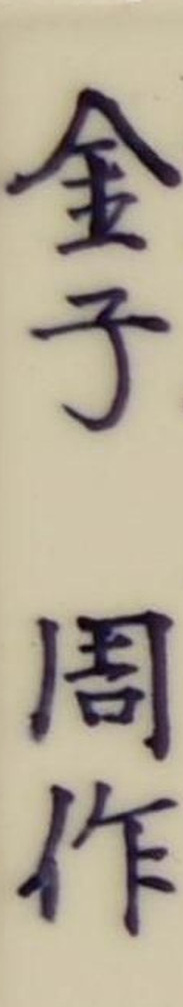金子周作

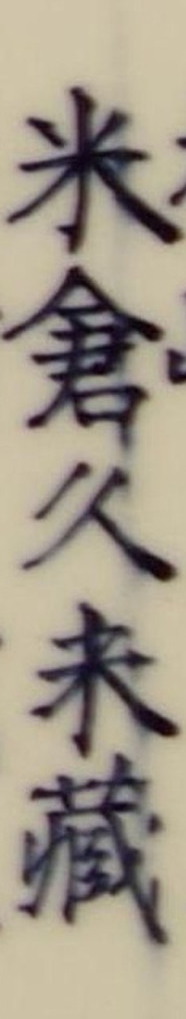米倉久未蔵
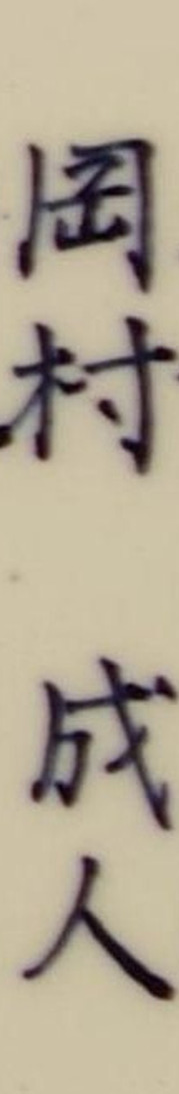岡村成人
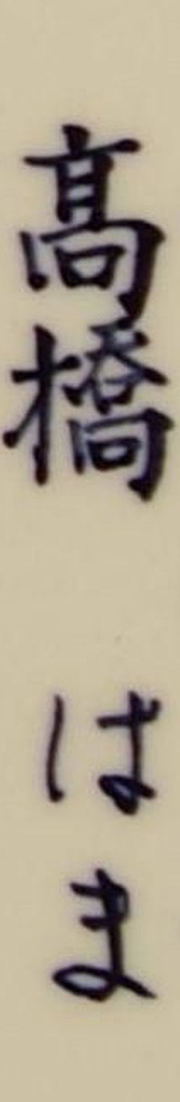高橋はま
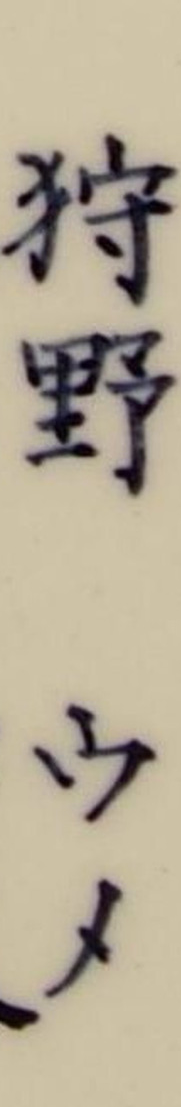狩野ウメ
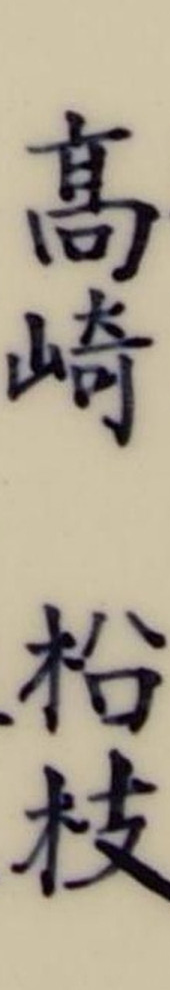高崎松枝
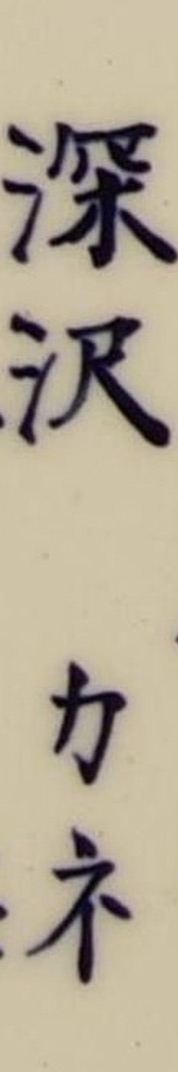深沢カネ
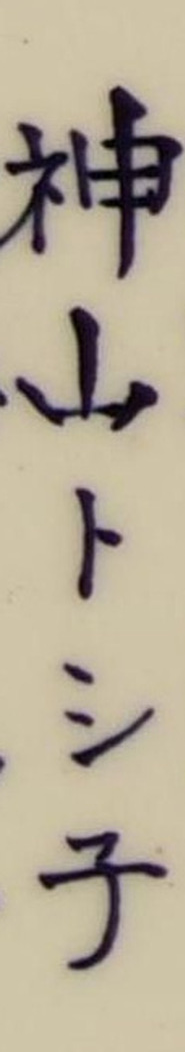神山トシ子
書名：E~L
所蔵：高野山金剛峯寺
